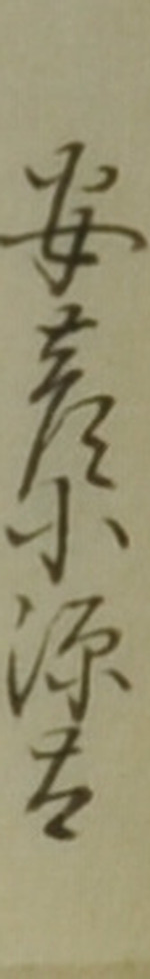安彦小源太
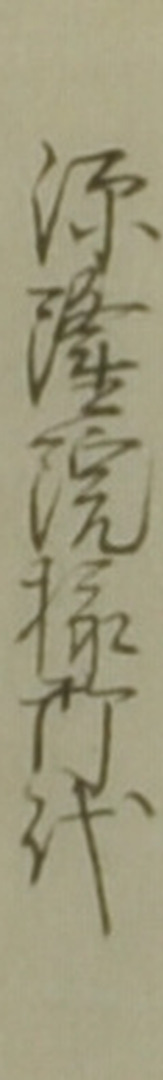源隆院様御代
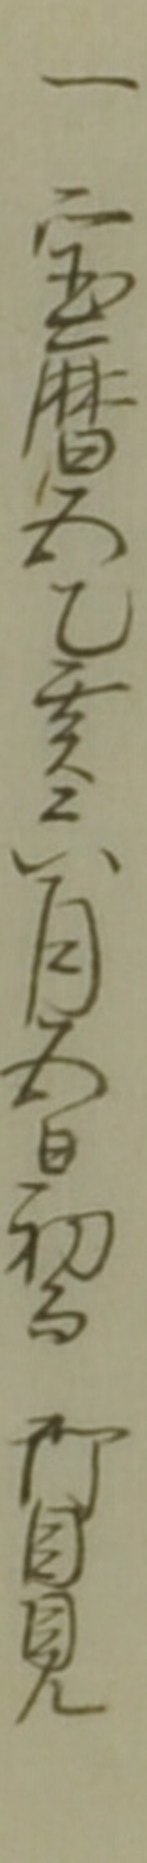一宝暦五乙亥六月五日初而お目見
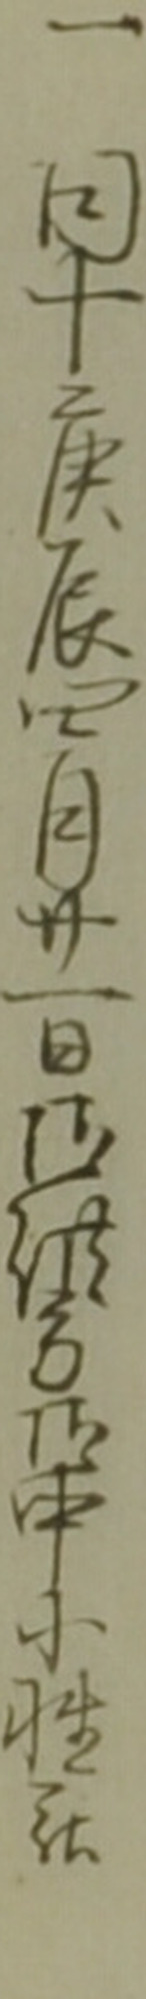一同十庚辰四月廿一日御供方中小性被
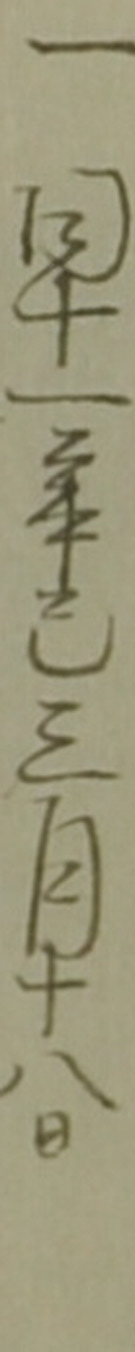一同十一辛己三月十八日
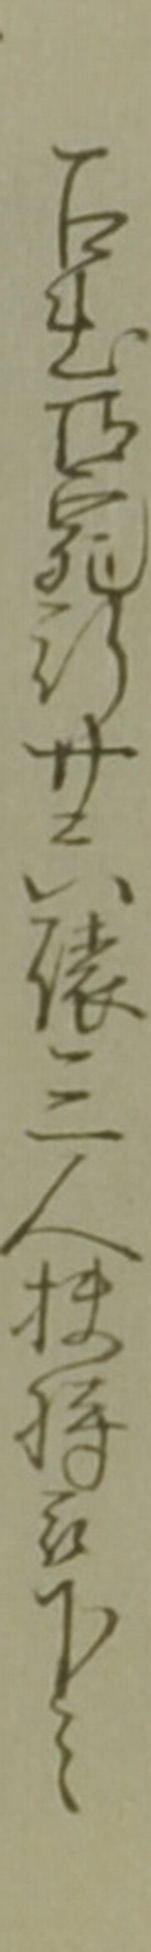召出御宛行廿六俵三人扶持被下候
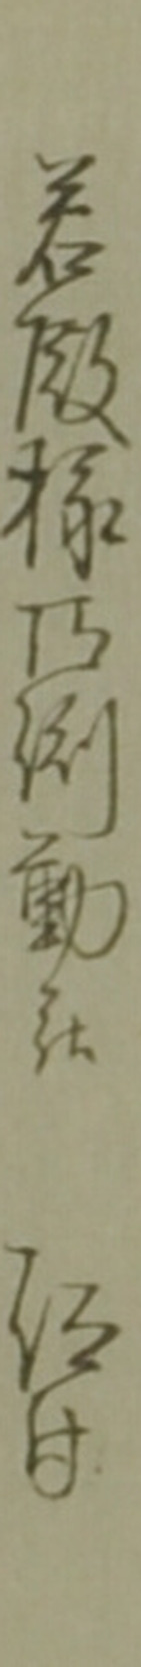若殿様御側勤被仰付
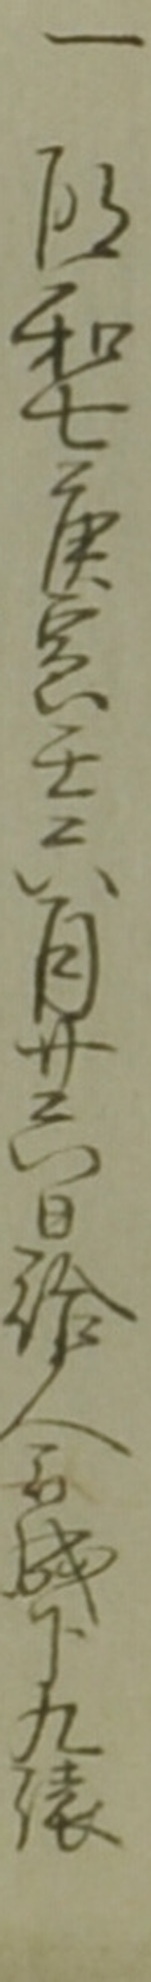一明和七庚寅閏六月廿六日給人被成下九俵
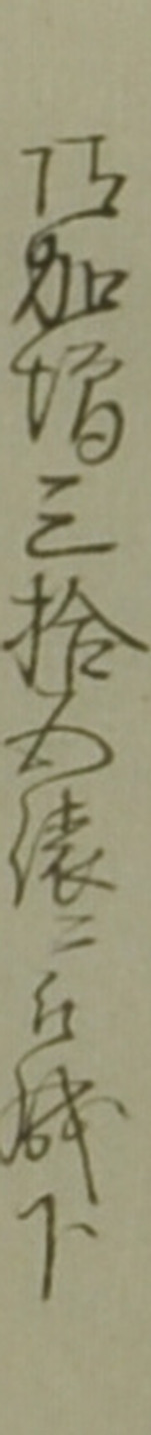御加増三拾五俵ニ被成下
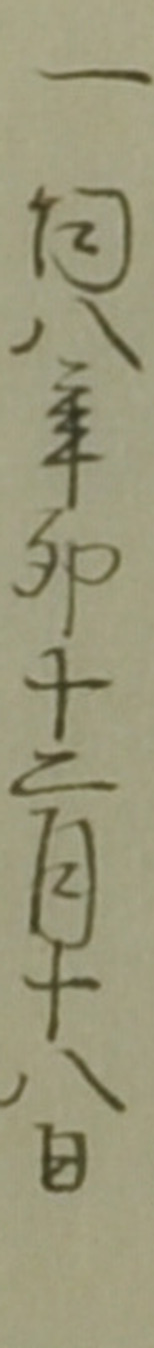一同八庚卯十二月十八日
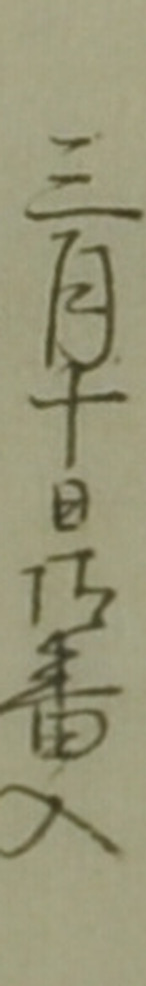三月十日御番入
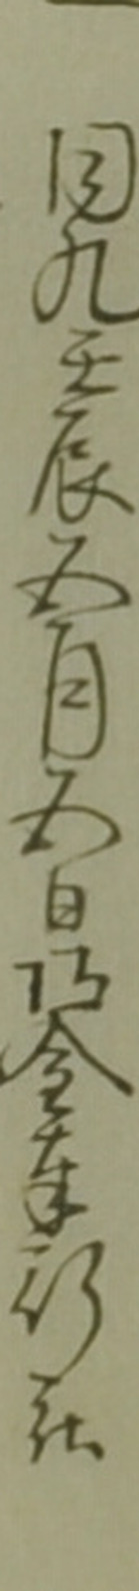一同九壬辰五月五日御金奉行被
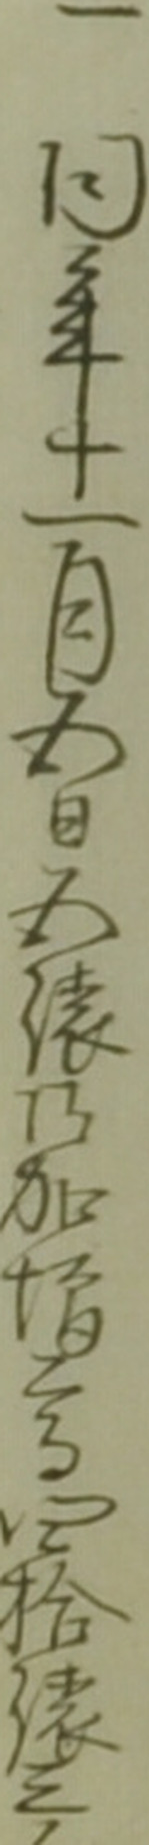一同年十一月五日五俵御加増高四拾俵三人
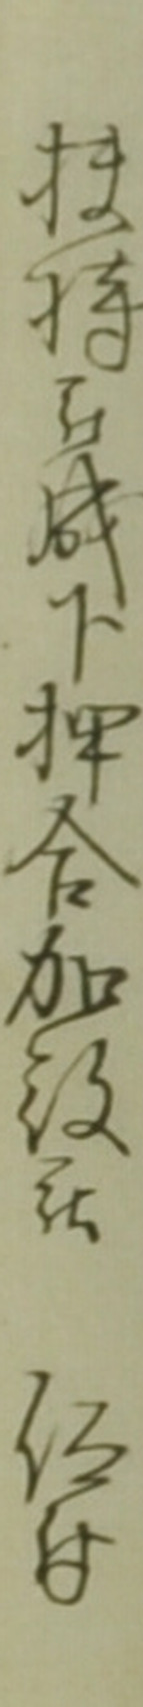扶持被成下押合加役被仰付

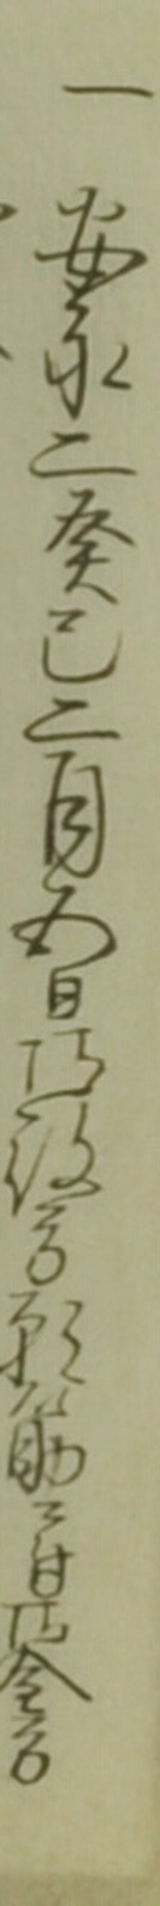一安永二癸巳二月五日御役方願筋二付御金方
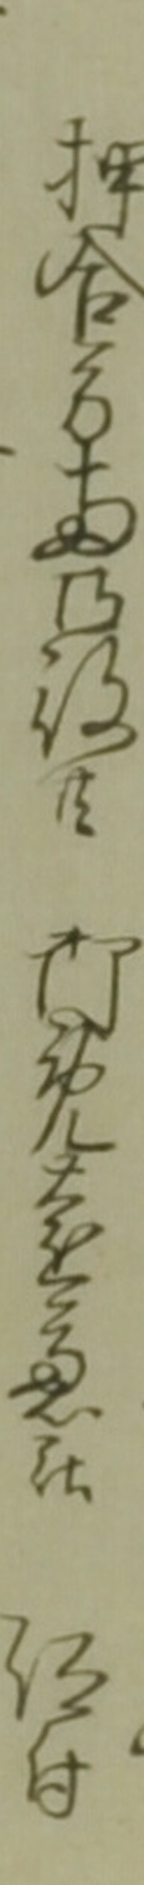押合方両御役共御免遠慮被仰付
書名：給人諸士勤仕録（三）
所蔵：伊那市立高遠町図書館・合同会社AMANE
